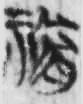○（禍）
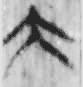大
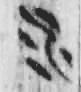水
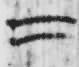二
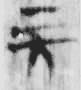天
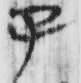子
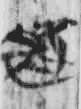既
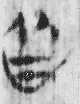皆
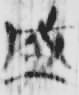城（成）
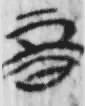○（期）
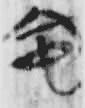○（中）
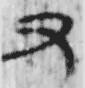又（有）
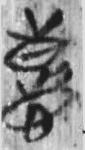憙（喜）
